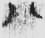八
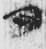月
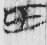甲
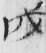戌
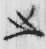之
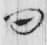日
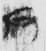尹
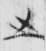之
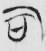司
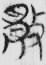敗
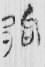邭
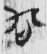叴
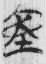○（夷）
